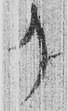人
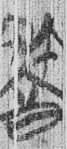○（孰）
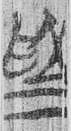爲
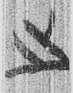之
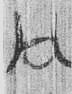公
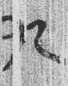九
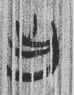出
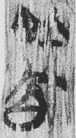○（孰）
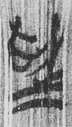爲
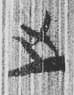之
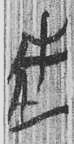○（封）
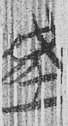○（吾）
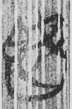既
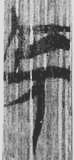長
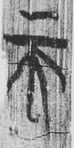而
